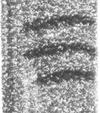三
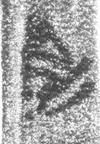彫（雕）
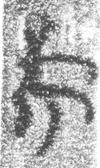○（巹）
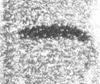一
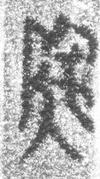{竹林火}
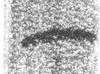一
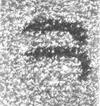二
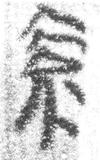赤
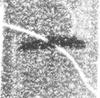一
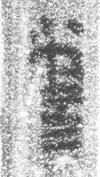○（尊）
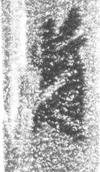○（橛）
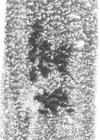厀（漆）
